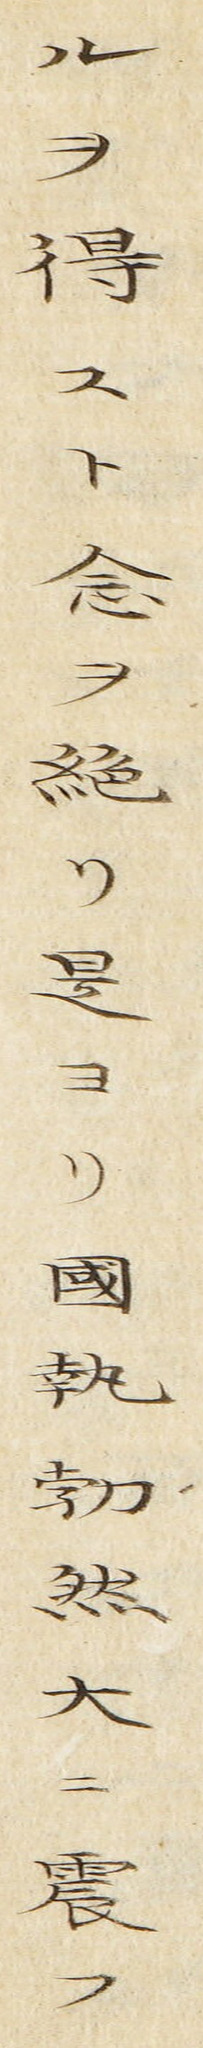ルヲ得スト念ヲ絶リ是ヨリ國執勃然大ニ震フ
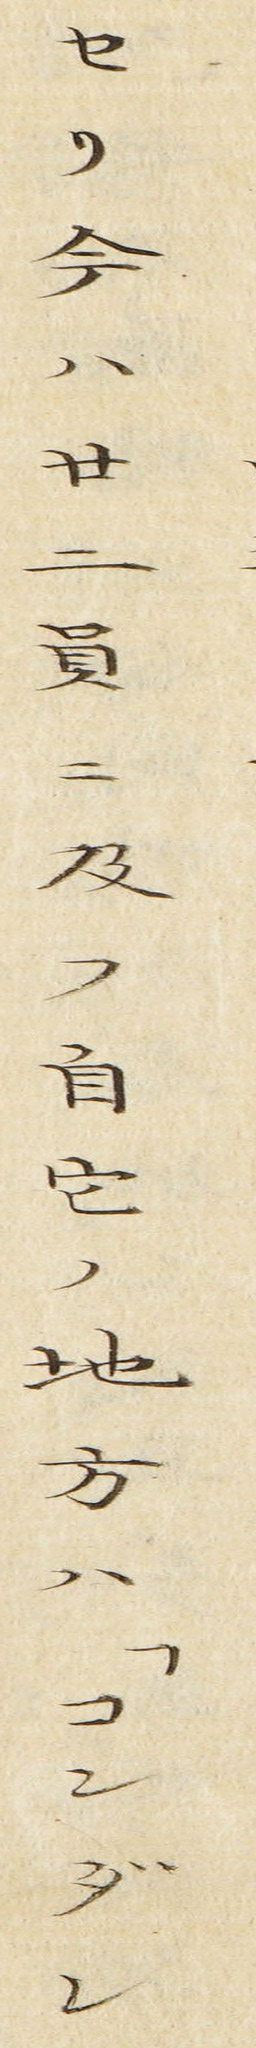セリ今ハ廿ニ員ニ及フ自它ノ地方ハ「コンダレ

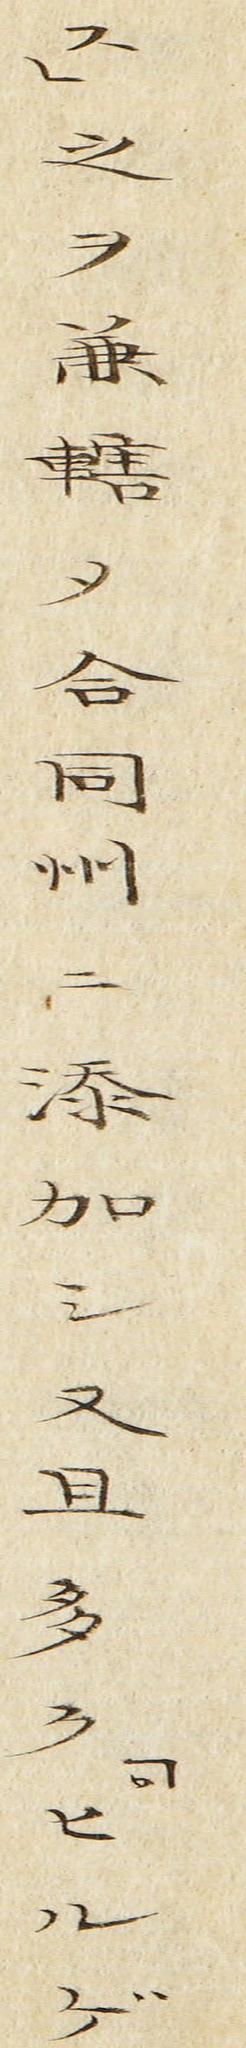ス」之ヲ兼轄シテ合同州ニ添加シ又且多ク「ピルゲ
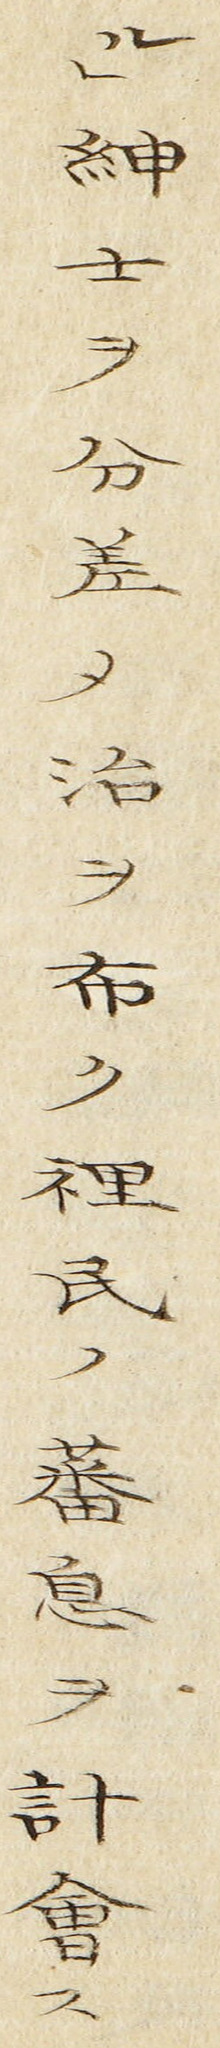ル」紳士ヲ分差シテ治ヲ布ク裡民ノ蕃息ヲ計會ス
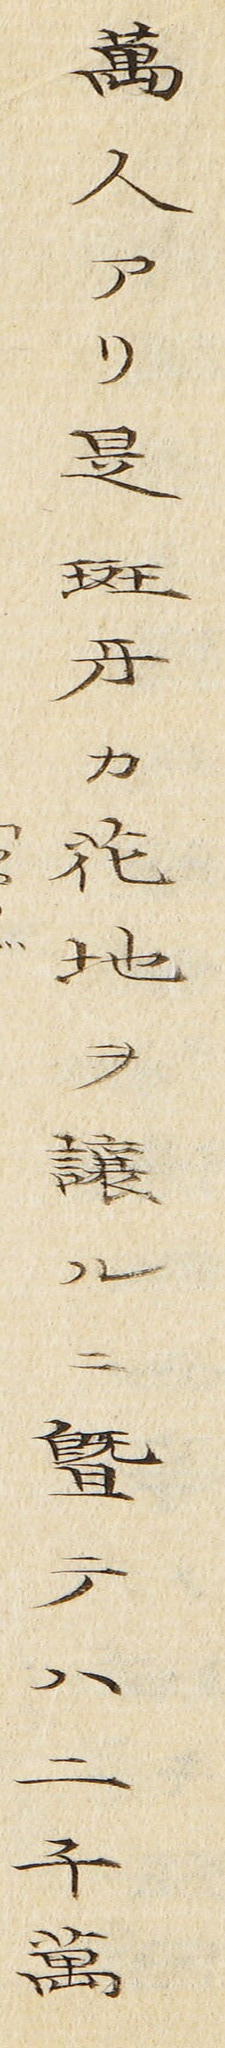萬人アリ是斑牙カ花地ヲ譲ルニ曁テハ二千萬
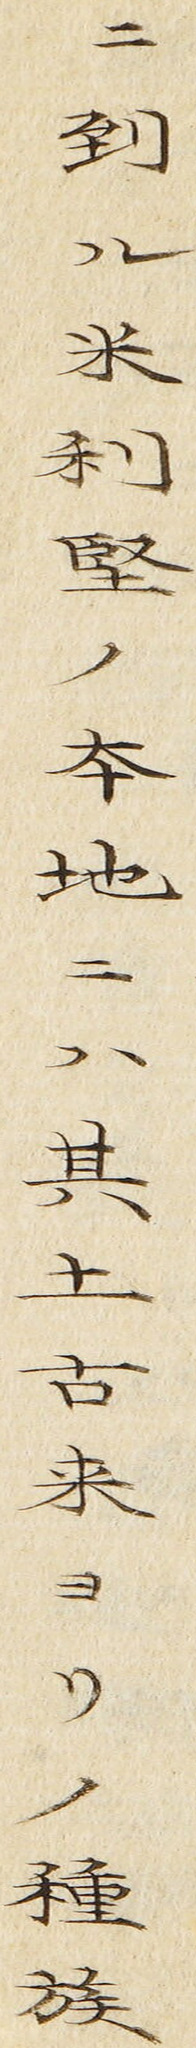ニ到ル米利堅ノ本地ニハ其土古来ヨリノ種族
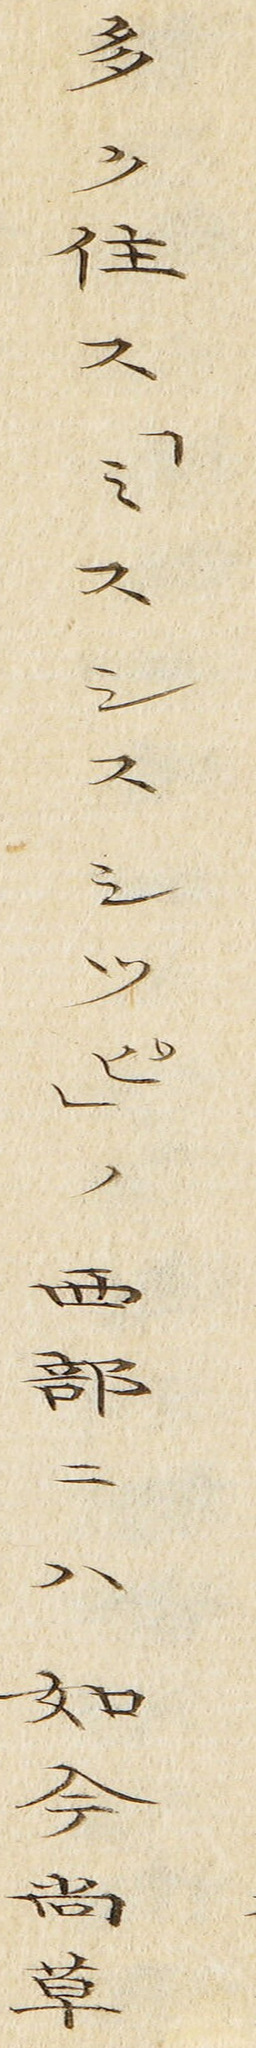多ク住ス「ミスシスシツピ」ノ西部ニハ如今尚草
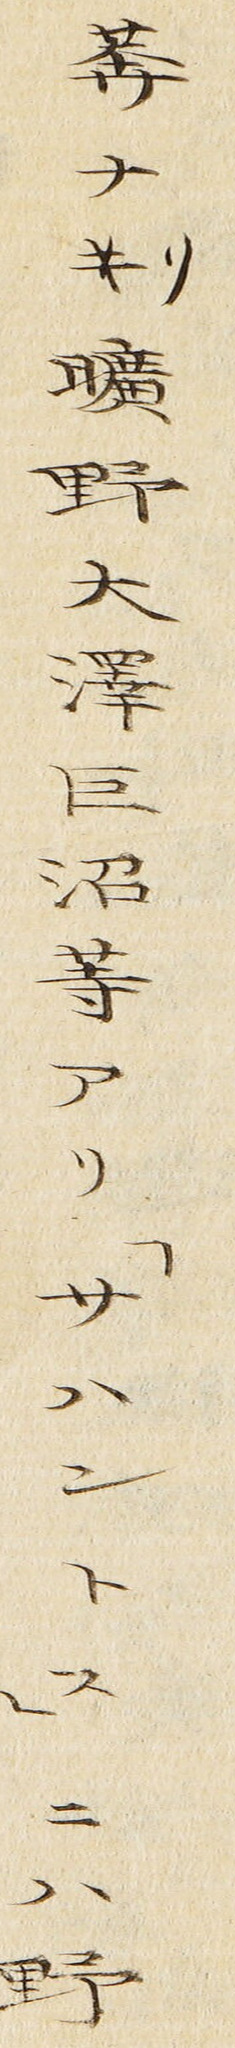莾ナリ曠野大澤巨沼等アリ「サハントス」ニハ野
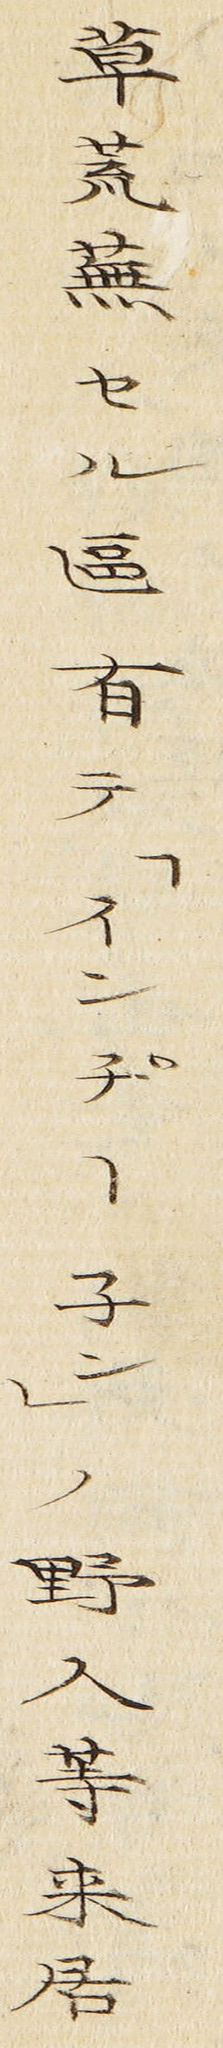草荒蕪セル區有テ「インヂーネン」ノ野人等来居
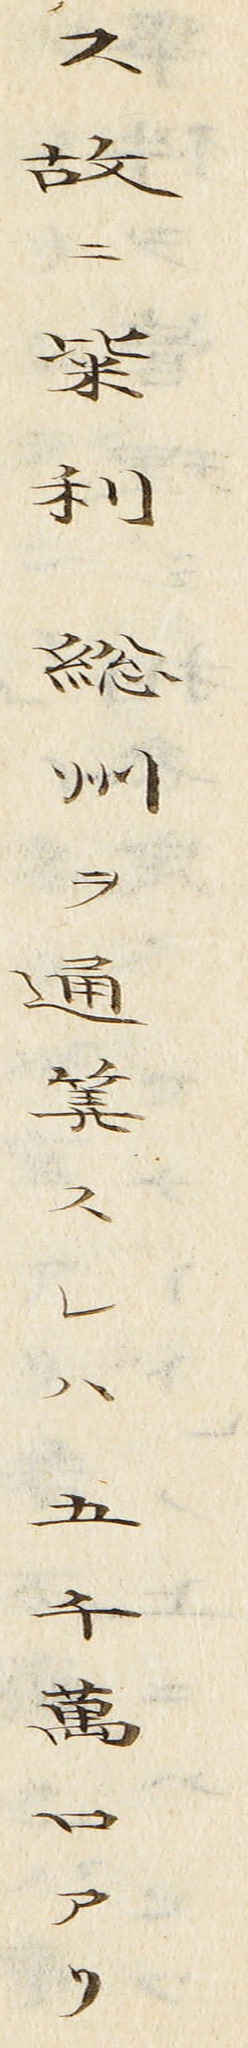ス故ニ利総州ヲ通筭スレハ五千萬口アリ
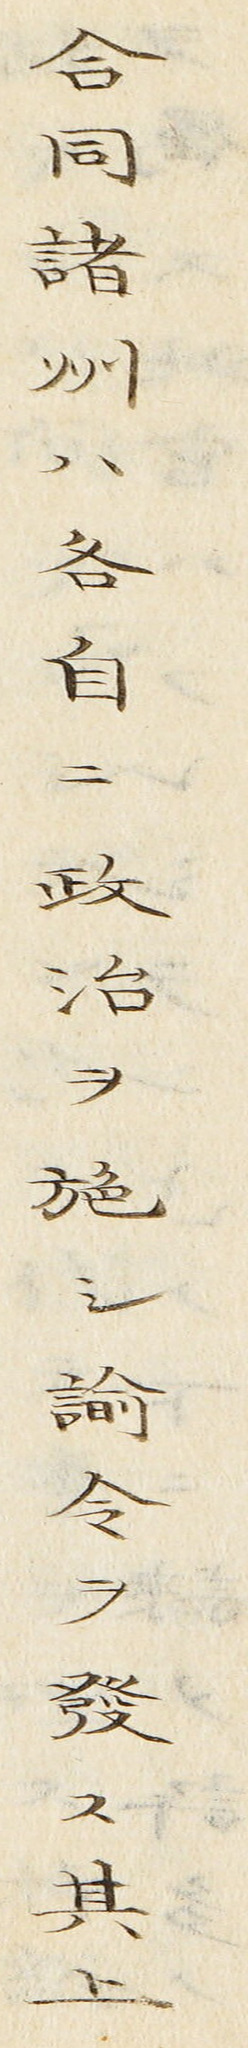合同諸州ハ各自ニ政治ヲ施シ諭令ヲ發ス其上
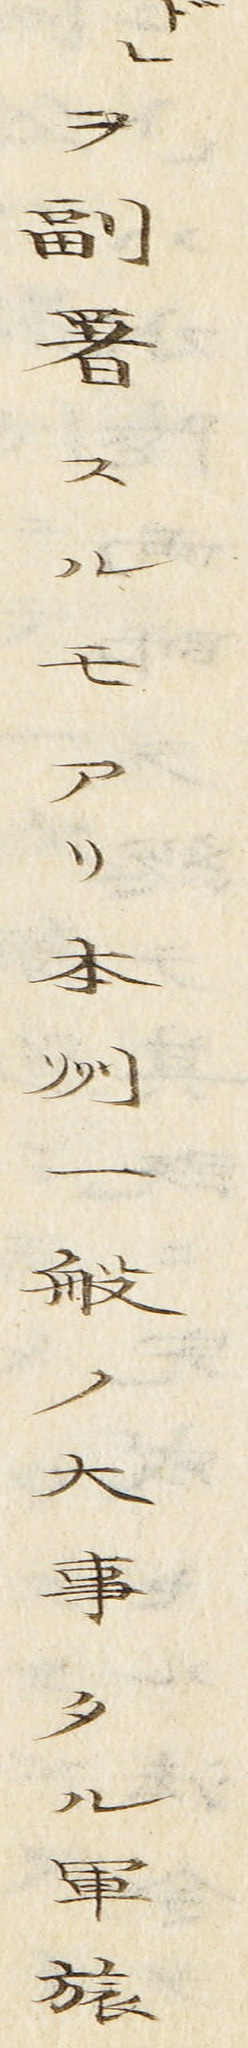ド」ヲ副署スルモアリ本州一般ノ大事タル軍
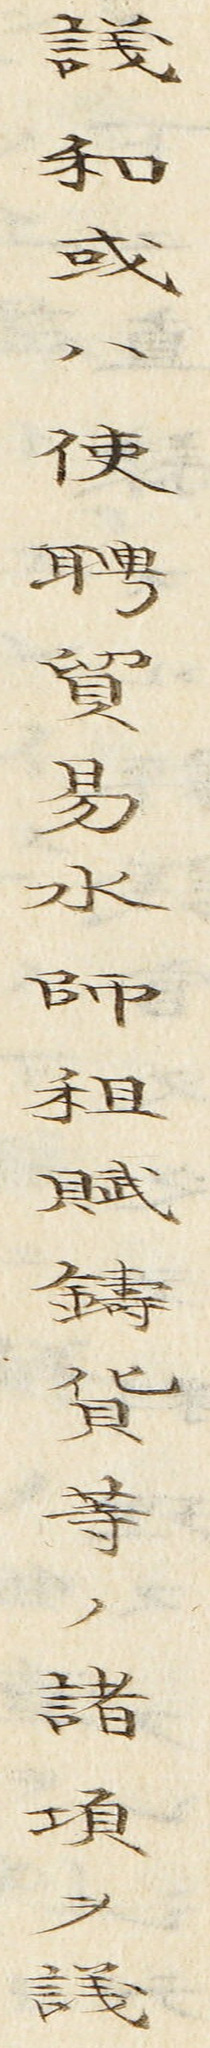議和或ハ使聘貿易水師租賦鑄貨等ノ諸項ヲ議
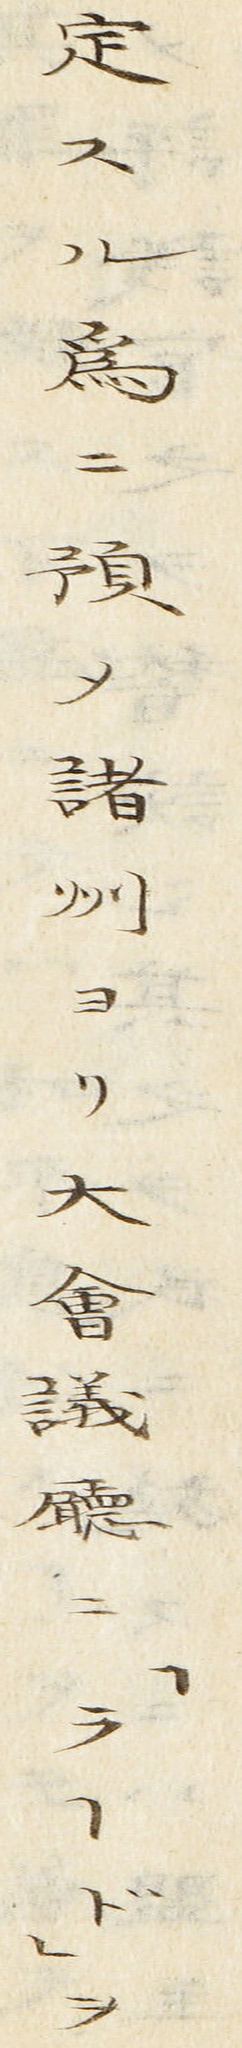定スル爲ニ預シテ諸州ヨリ大會議廳ニ「ラード」ヲ
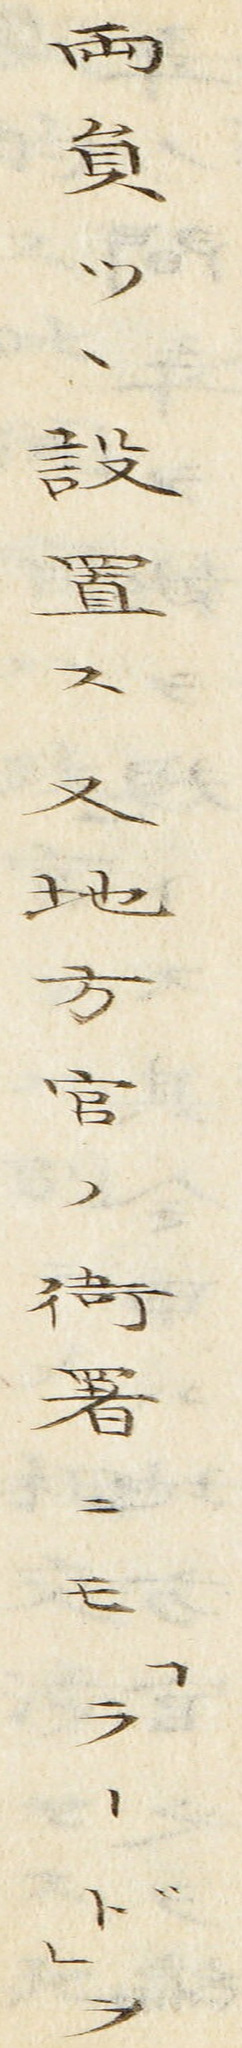両員ツゝ設置ス又地方官ノ衙署ニモ「ラード」ヲ
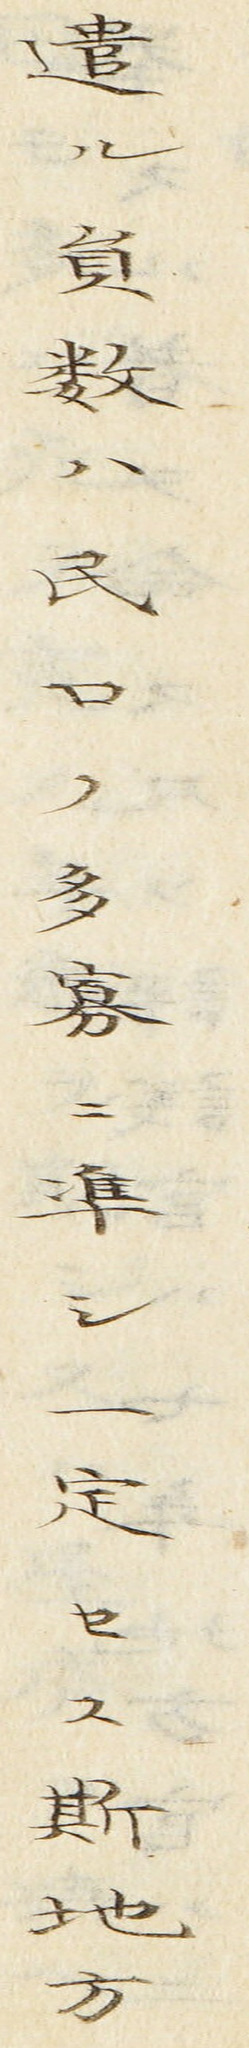遣ル員数ハ民口ノ多寡ニ準シ一定セス斯地方
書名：蕃談
